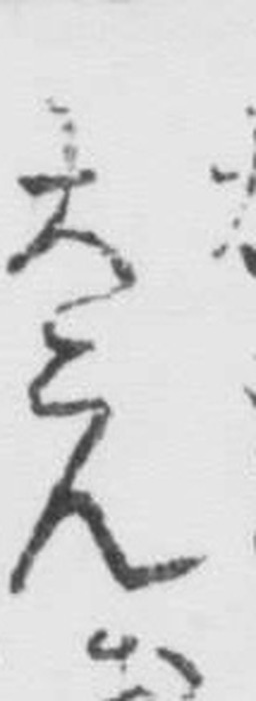大こん
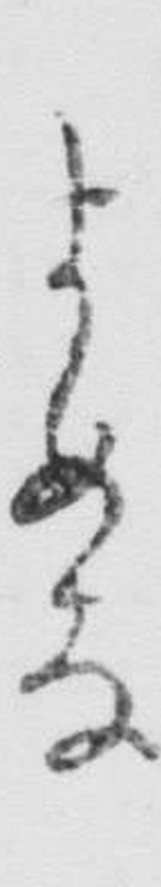よめな
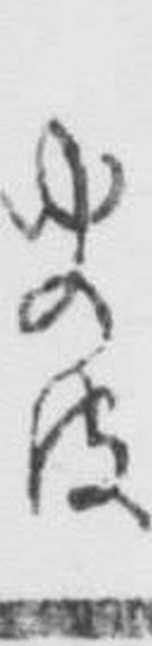ゆの皮
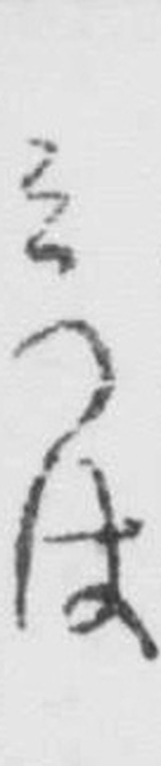みつは
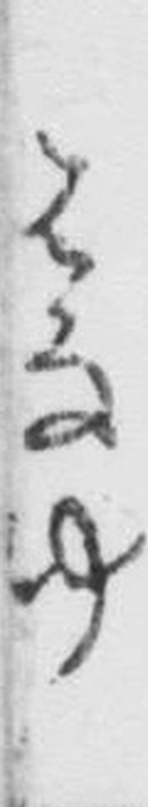はなゆ

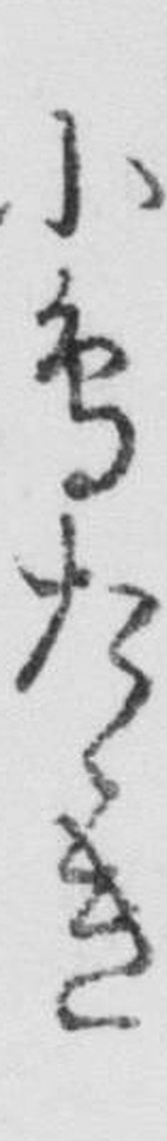小鳥たゝき
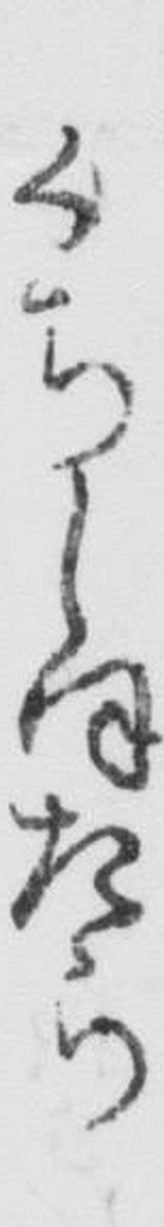くちしほたら
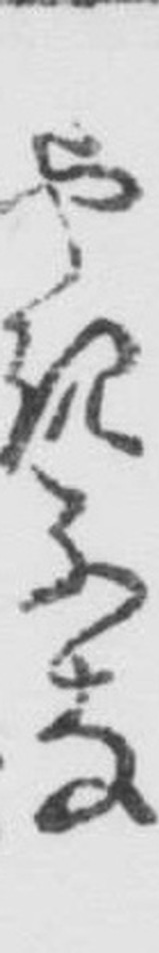やきふな
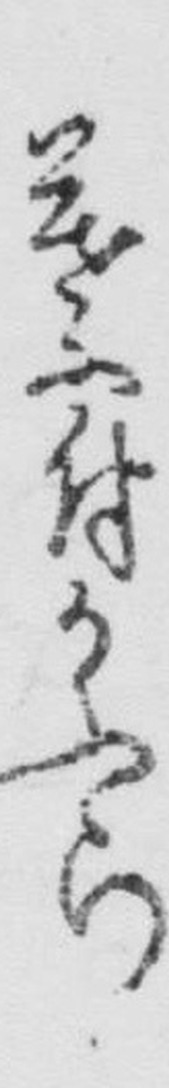葉付かふら
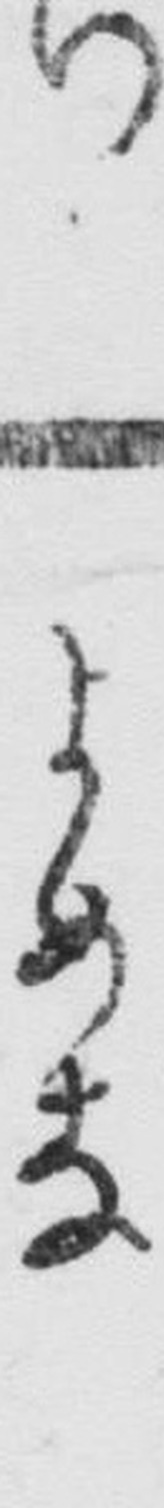よめな
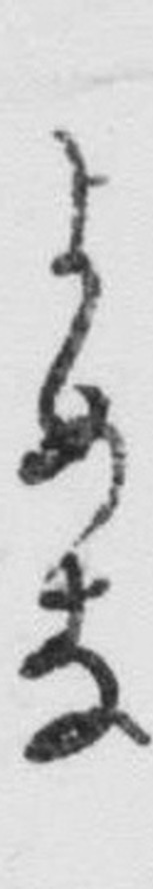よめな
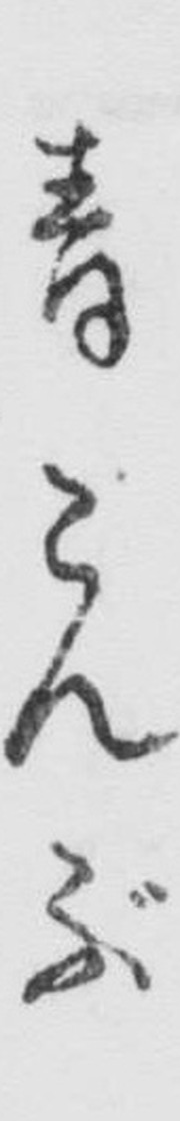青こんぶ
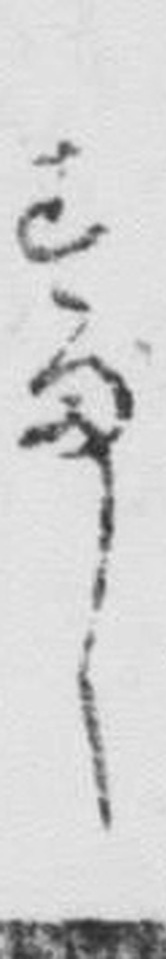すまし
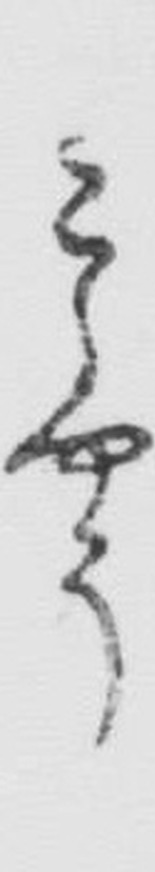こしやう
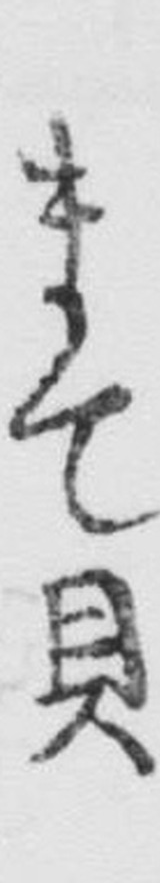まて貝
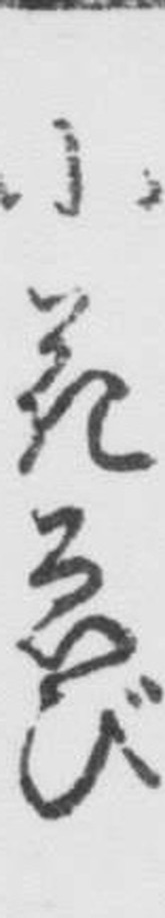小花ゑび
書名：諸家通用/即席料理
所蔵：大阪府立大学学術情報センター 国文学研究資料館
